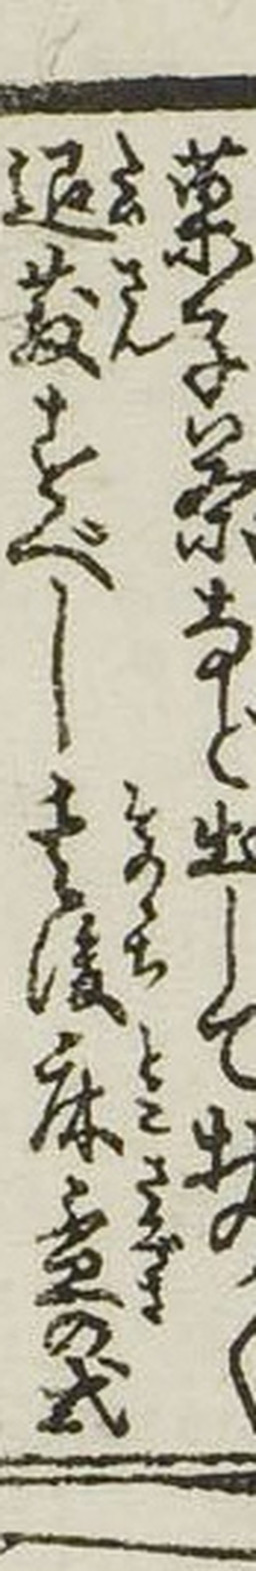退散すべし其後床盃の式
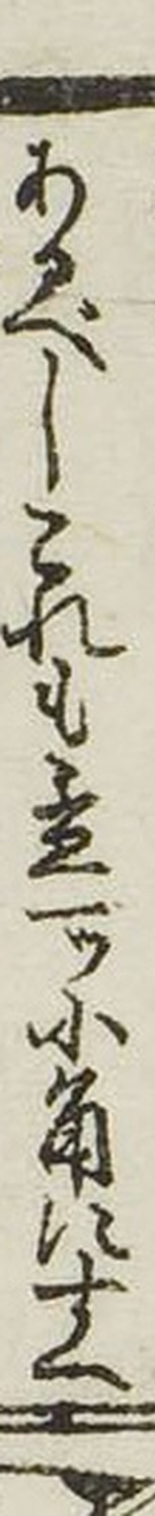あるべしこれも盃一ッ小角にすへ
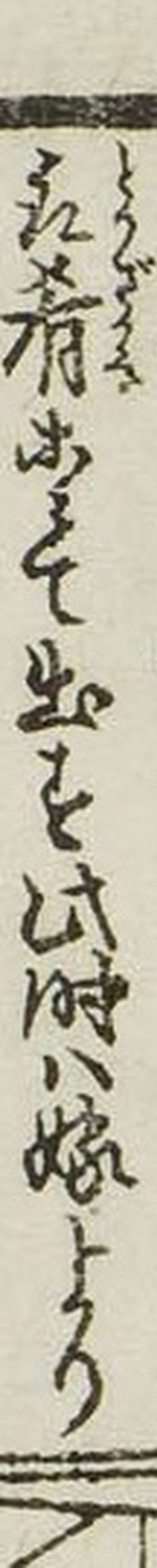取肴等にて出す此時は嫁より
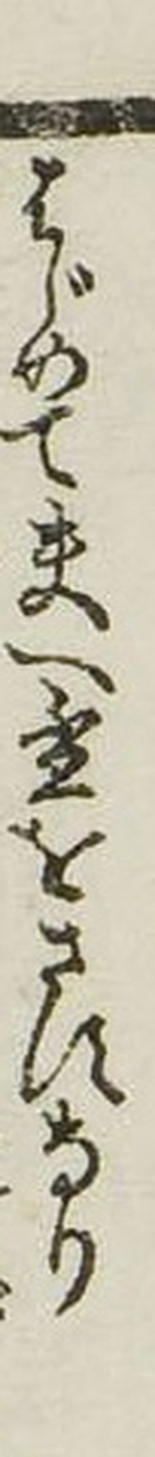はじめて夫へ盃をさすなり
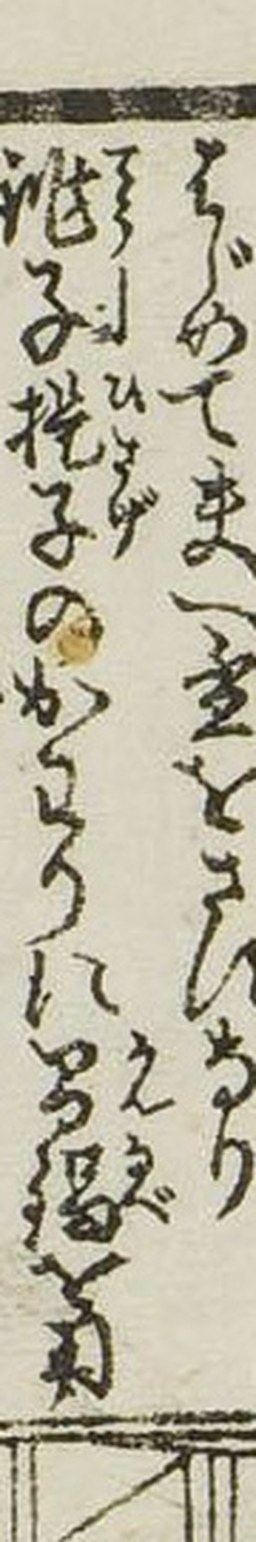銚子提子のかわりに間鍋を用
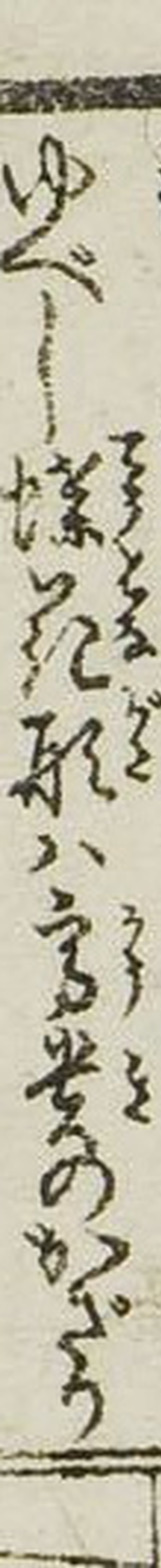ゆべし蝶花形高貴のかざり
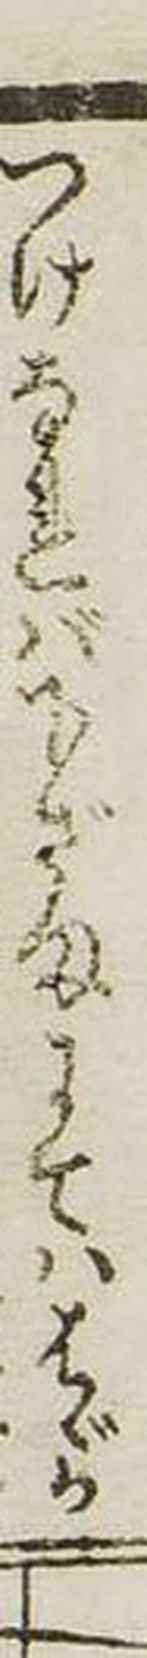つけなれば下ざまにてははばか
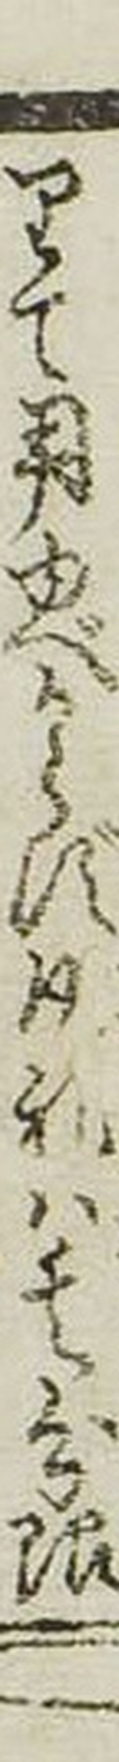りて用ゆべからず凡礼は其分限
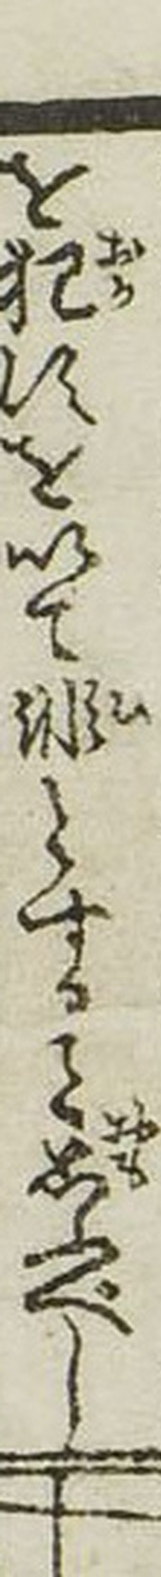を犯すを以て非とすること思ふべし

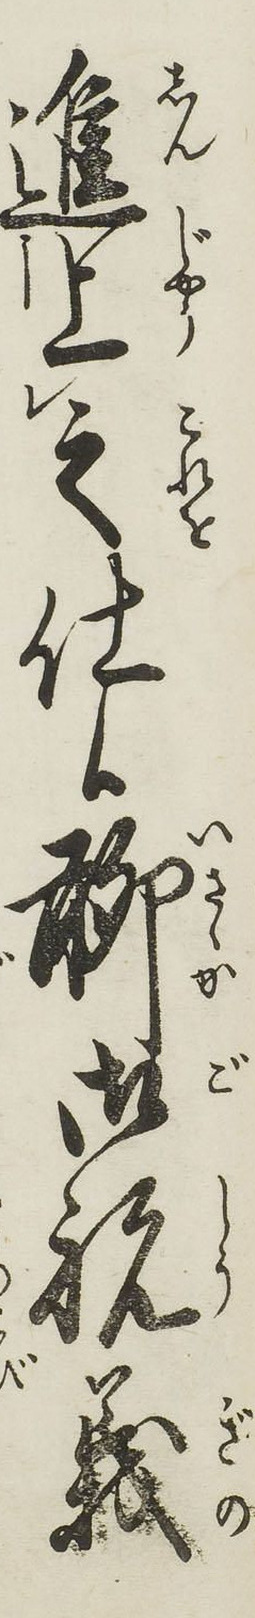進-上之仕候聊祝義

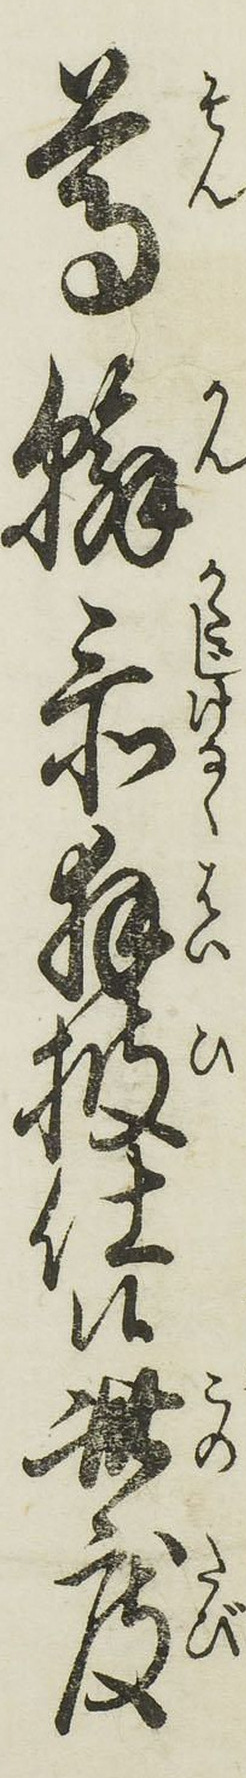尊翰忝拝披仕候此度
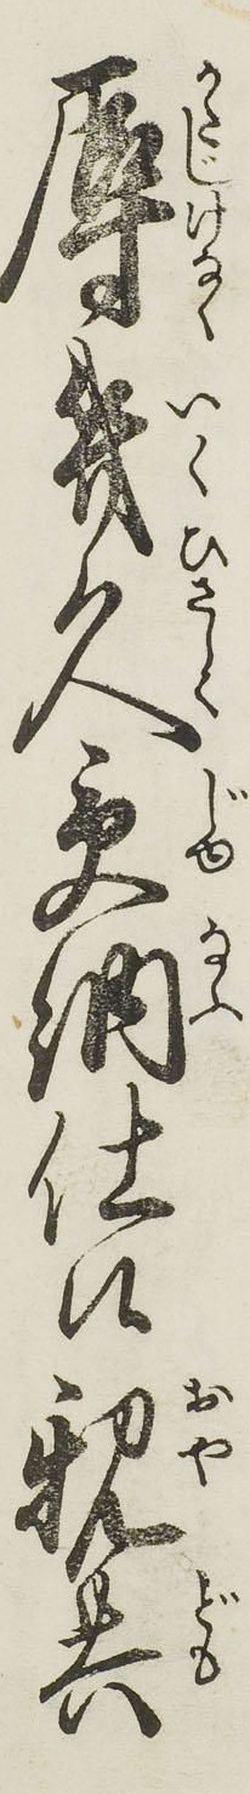辱幾久受納仕共親共
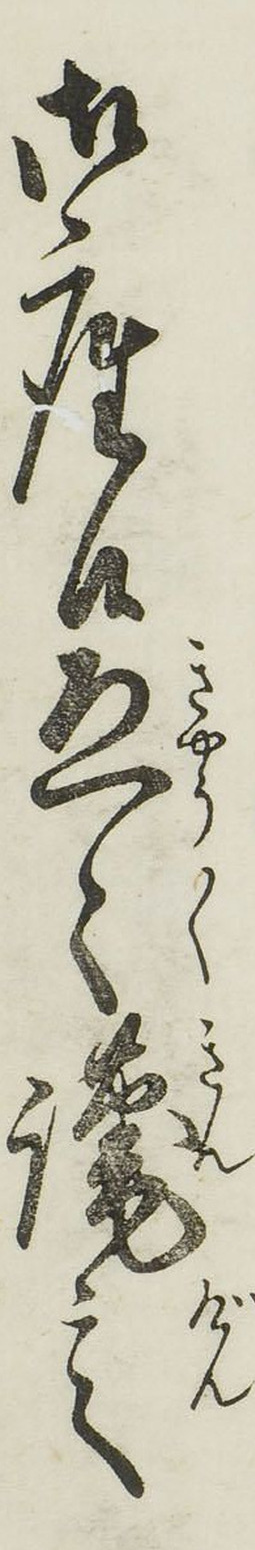御座候恐々謹言

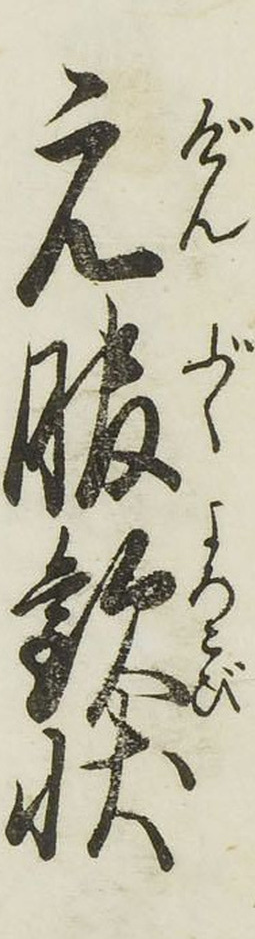元服歓状

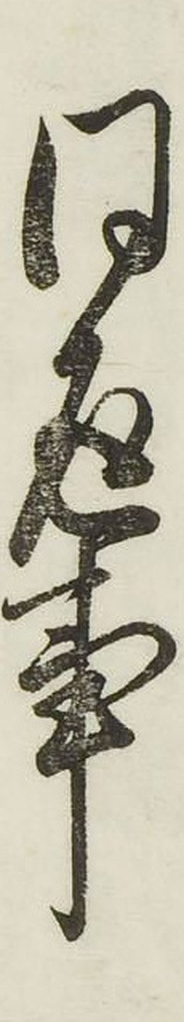同返事
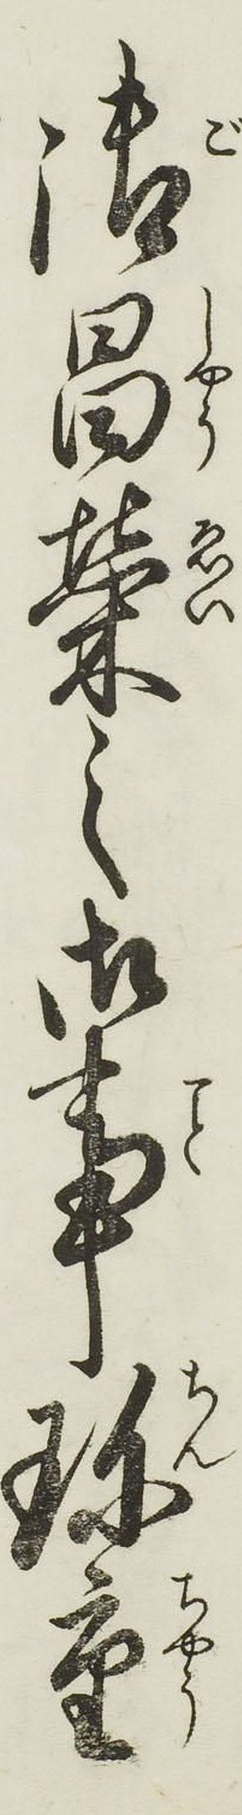御昌栄之御事珍重
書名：商人書翰便覧
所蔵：東京学芸大学教育コンテンツアーカイブ
